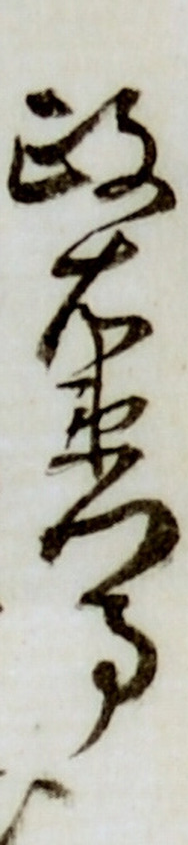政右衛門事
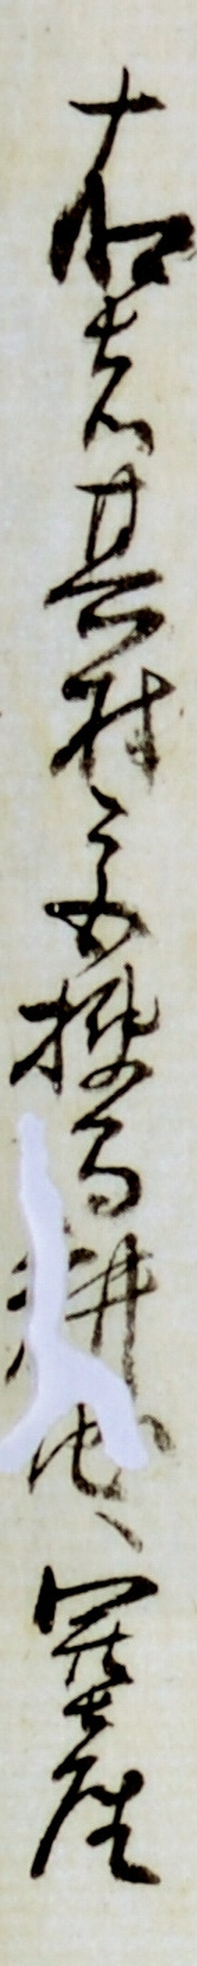右は其村宮挟間耕地へ開産

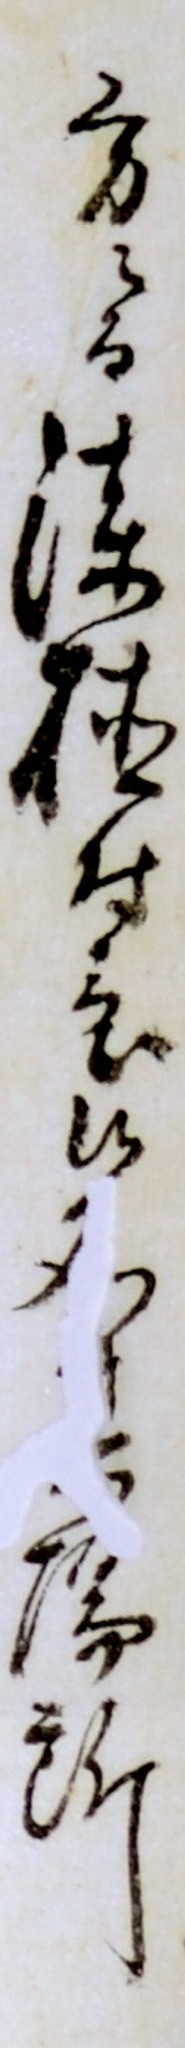方にて漆植付置候外其場所
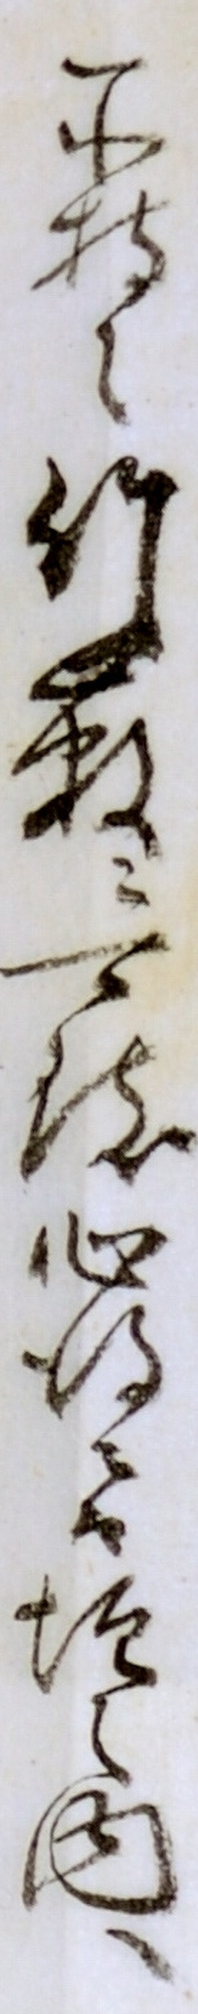所持之竹薮に可致心得にて垣之内へ
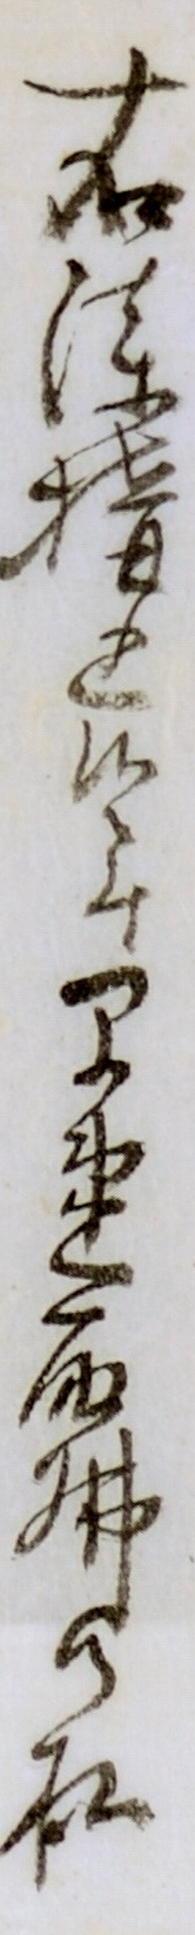右漆搆込候に付早速取払候様
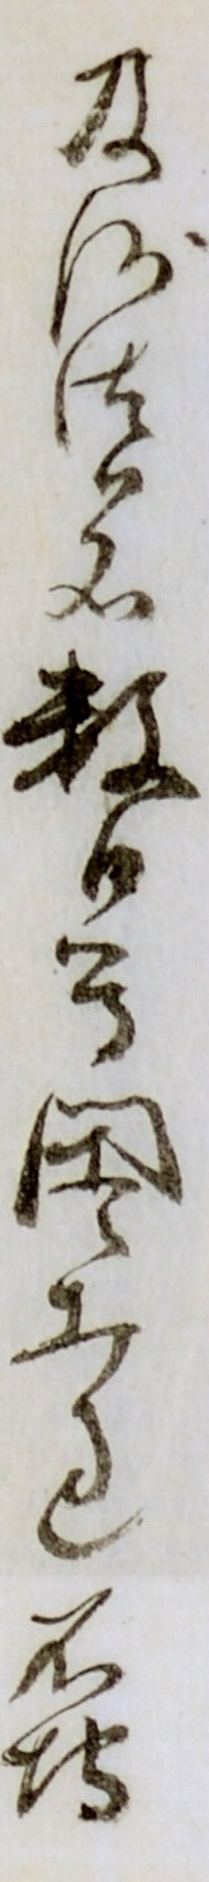及沙汰候処数日等閑に打過不埒
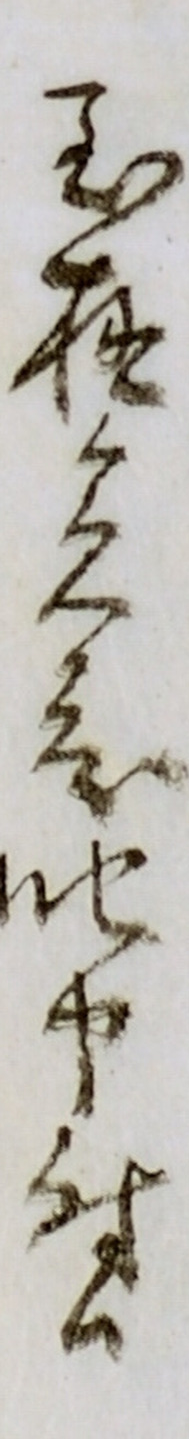至極急度叱申付候
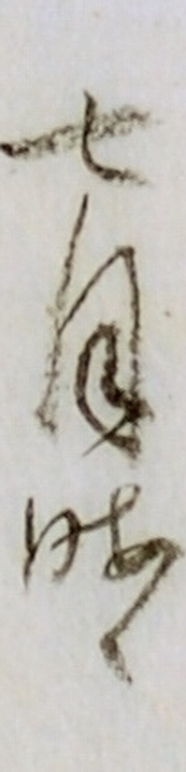七月晦日

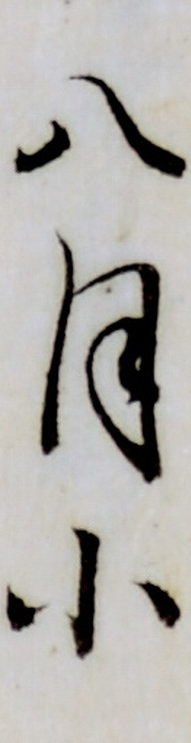八月小
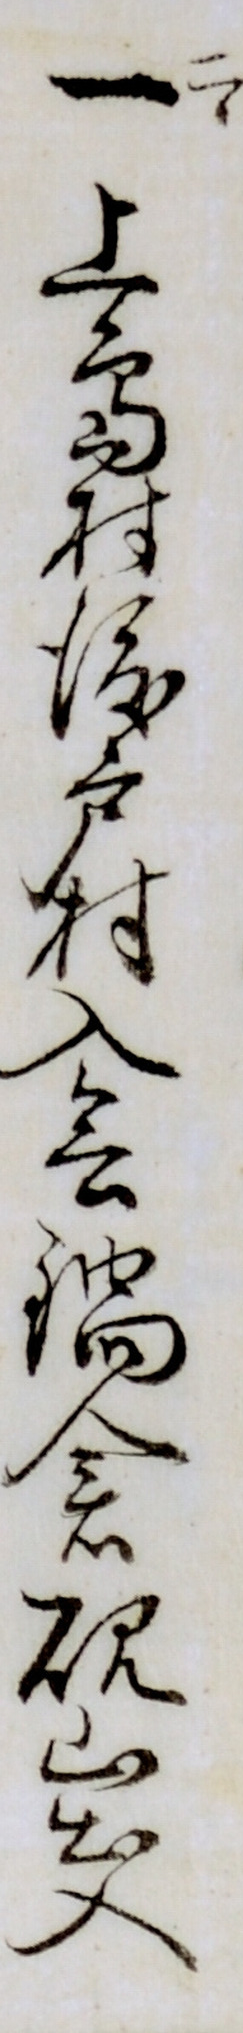一上島村渡戸村入会鍋倉硯山出入
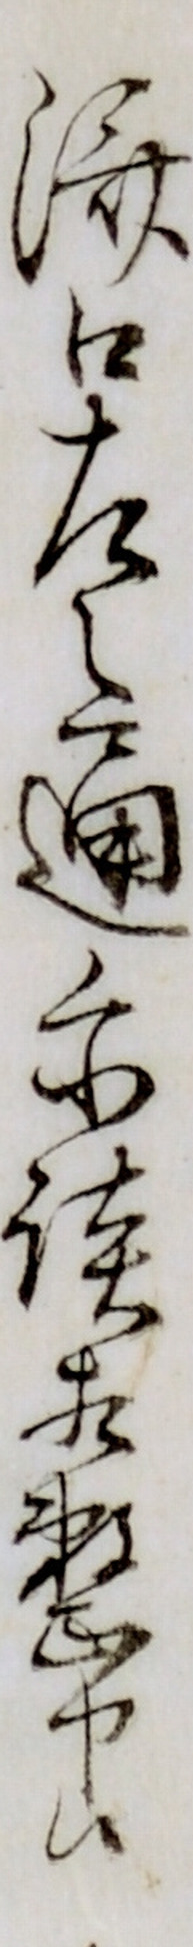済口左之通示談相整申候
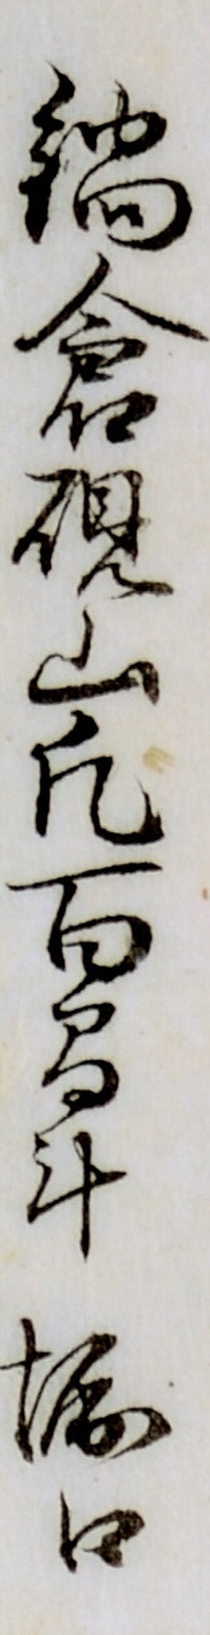鍋倉硯山凡百間計堀口
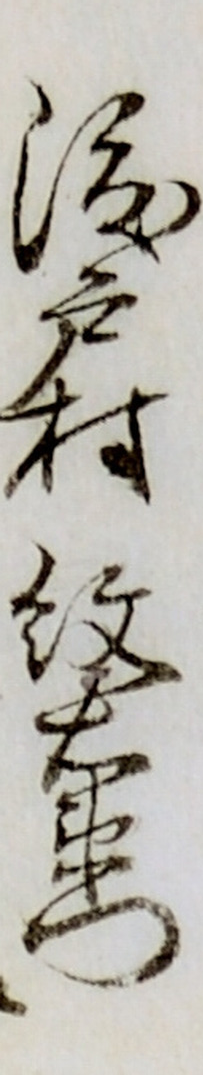渡戸村紋右衛門
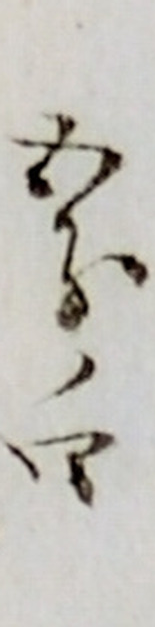五分ノ四
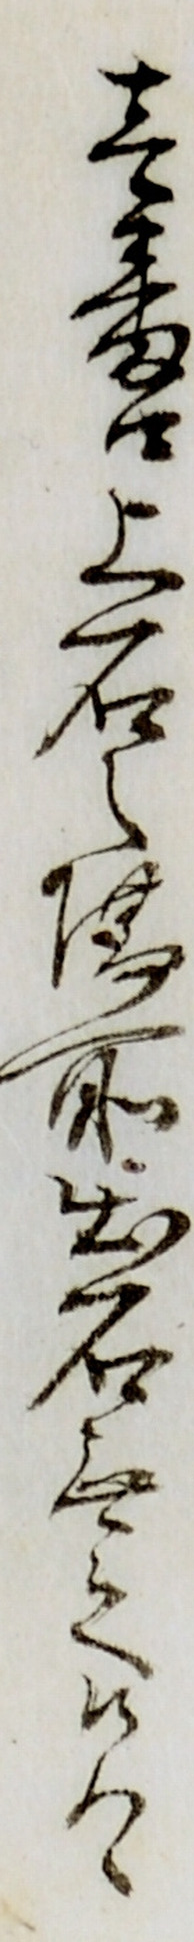壱番口上石之場所出石無之候はゝ
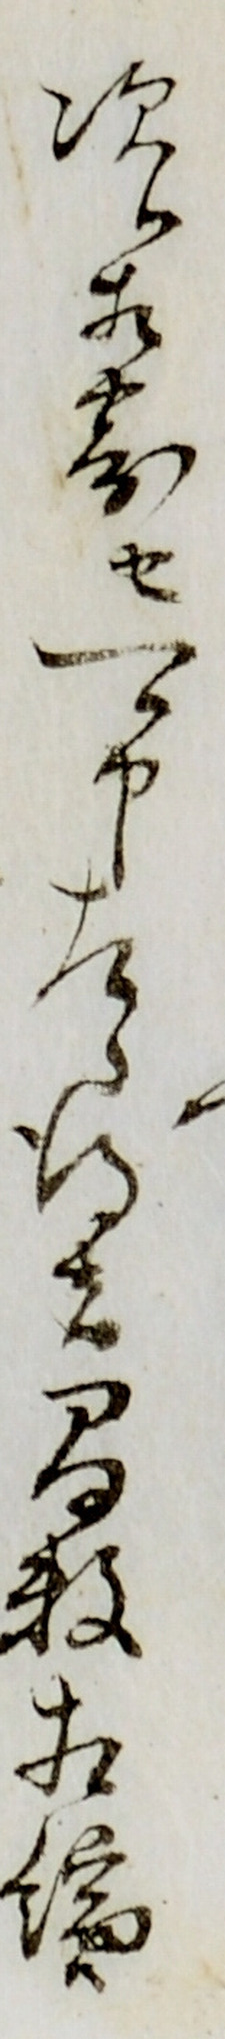次え相寄せ可申左候得は間数相縮候
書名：山林方諸事御用留
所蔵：伊那市立高遠町図書館・合同会社AMANE
